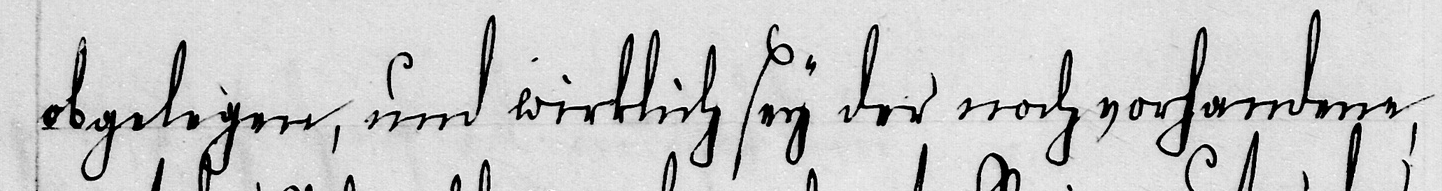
obgelegen, und wirklich sey der noch vorhandene,
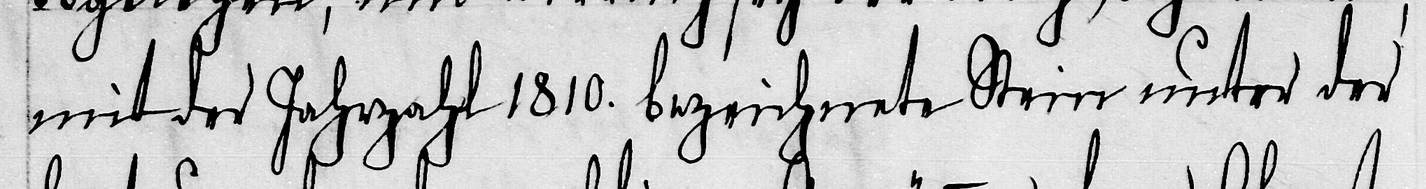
mit der Jahrzahl 1810. bezeichnete Stein unter der
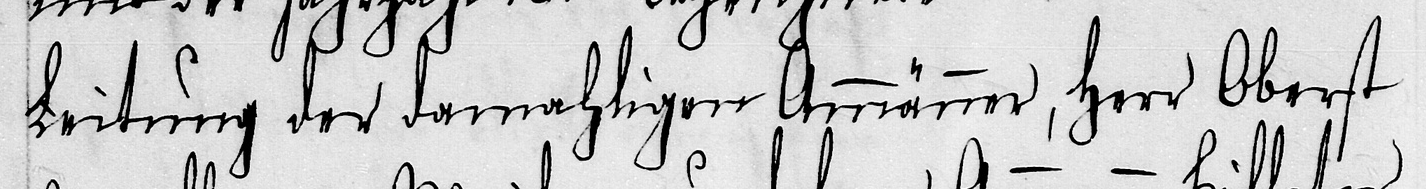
Leitung der damahligen Ammänner, Herr Oberst
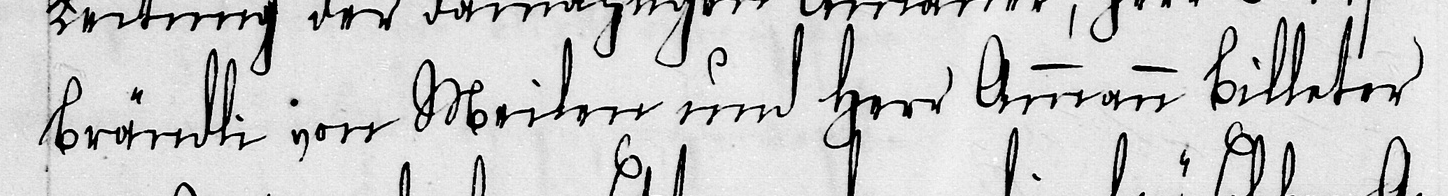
Brändli von Meilen und Herr Ammann Billeter
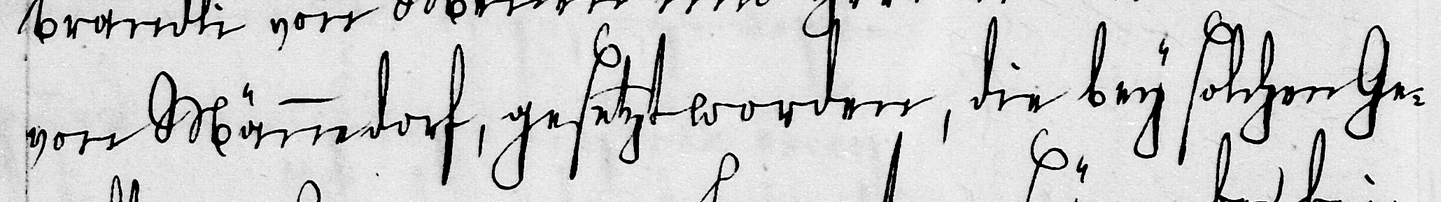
von Männedorf, gesetzt worden, die bey solchen Ge¬
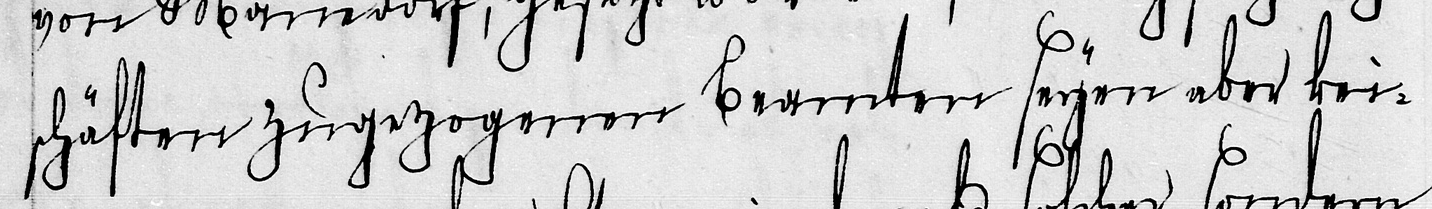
schäften zugezogenen Beamten seyen aber kei¬
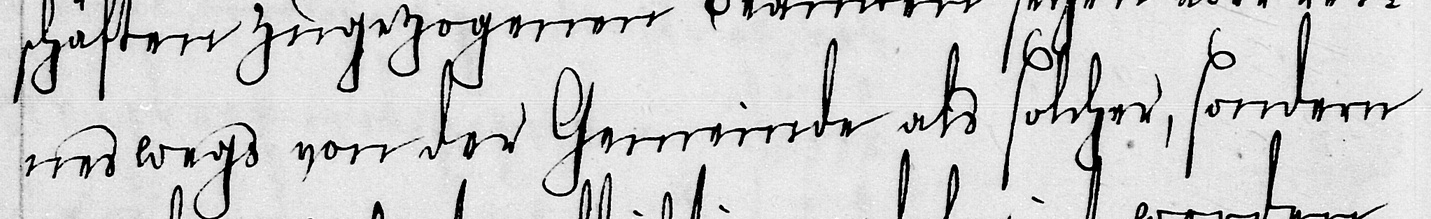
neswegs von der Gemeinde als solcher, sondern
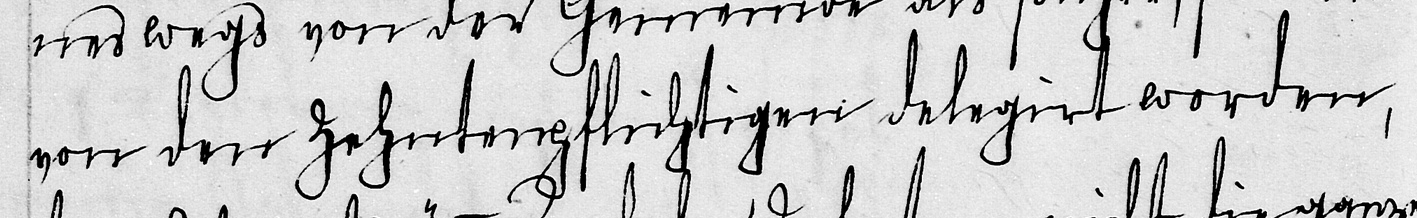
von den Zehntenpflichtigen delegirt worden,
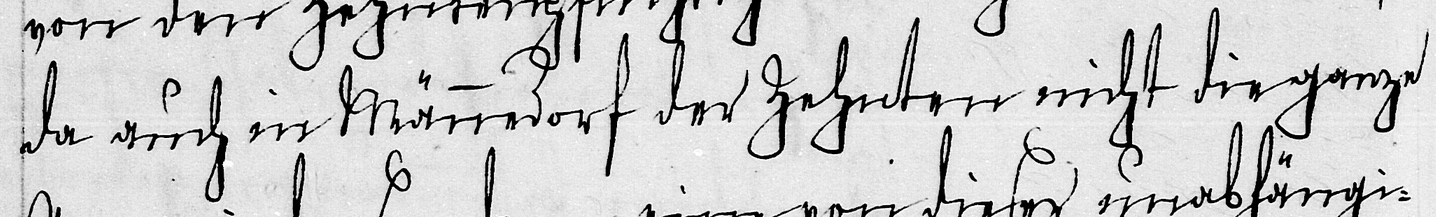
da auch in Männedorf der Zehnten nicht die ganze
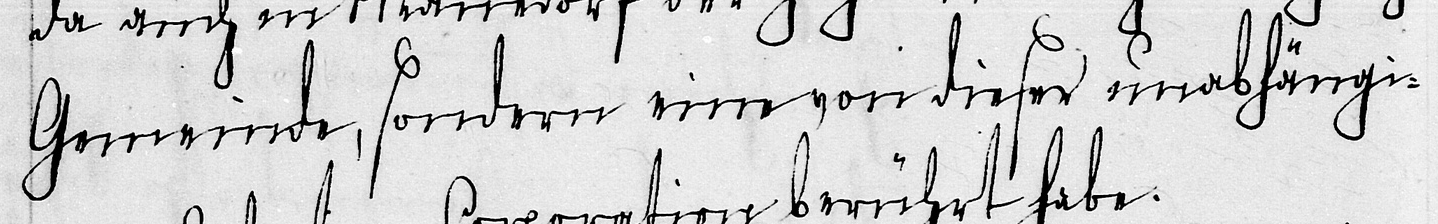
Gemeinde, sondern eine von dieser unabhängi¬
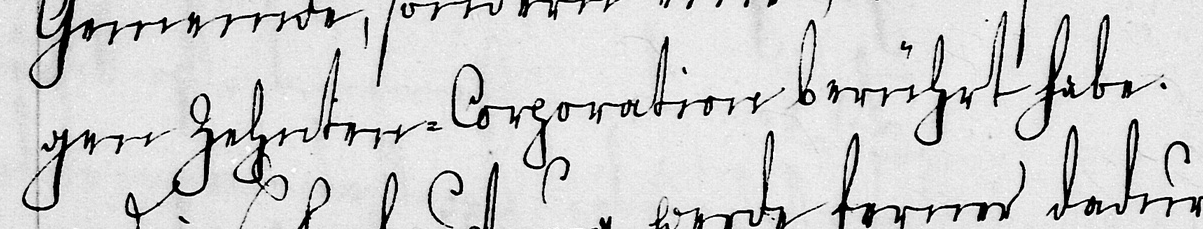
gen Zehnten-Corporation berührt habe.
